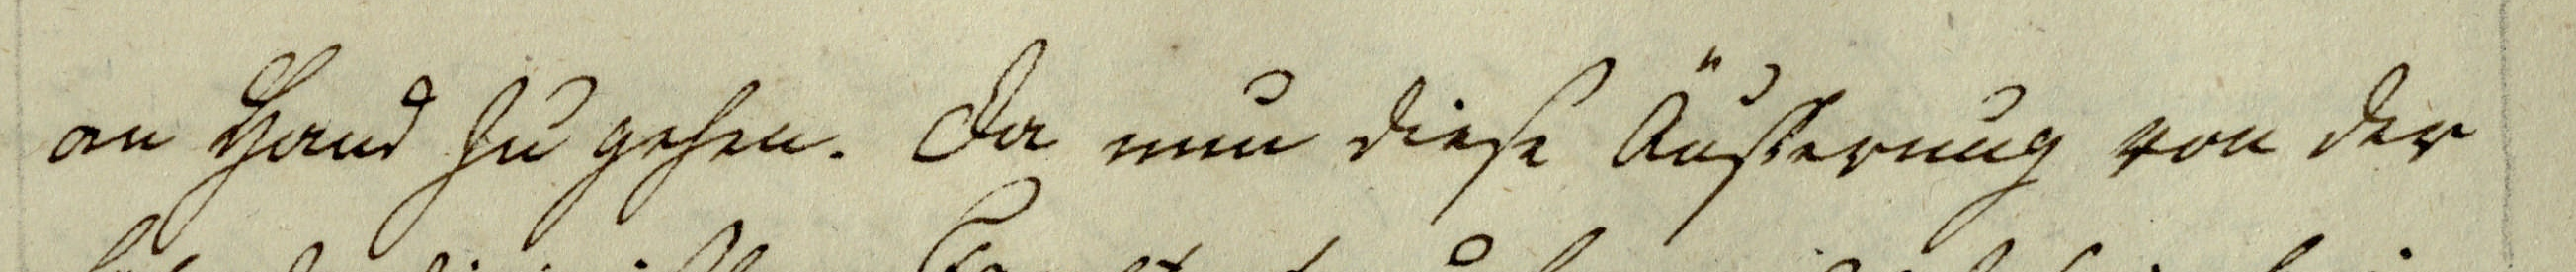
an Hand zu gehen. Da nun diese Äusserung von der
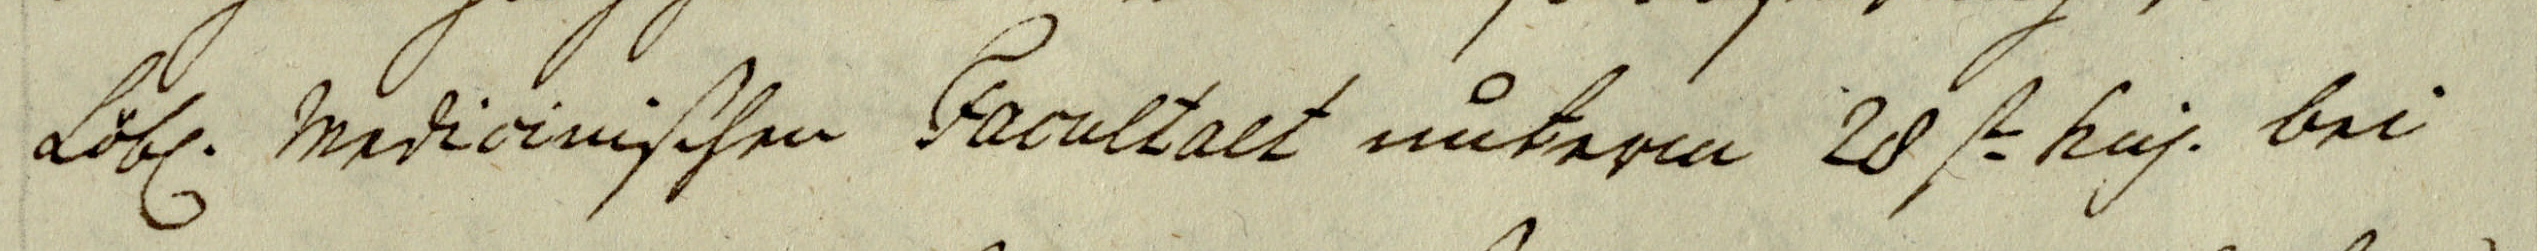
Löbl. Medicinischen Facultaet unterm 28 st huj. bei
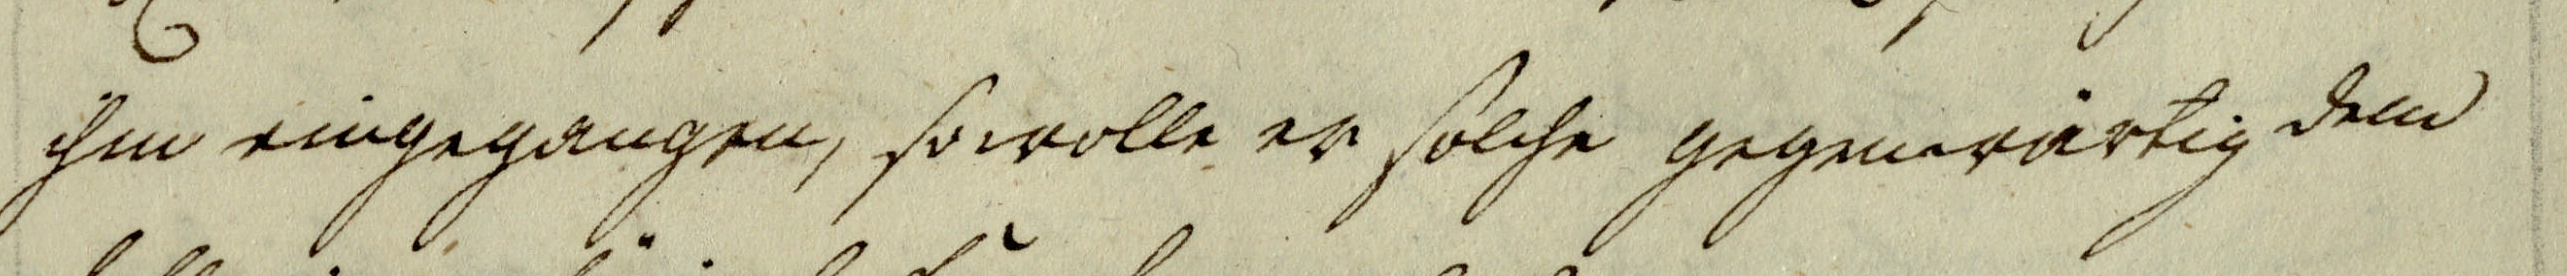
ihm eingegangen, so wolle er solche gegenwärtig dem
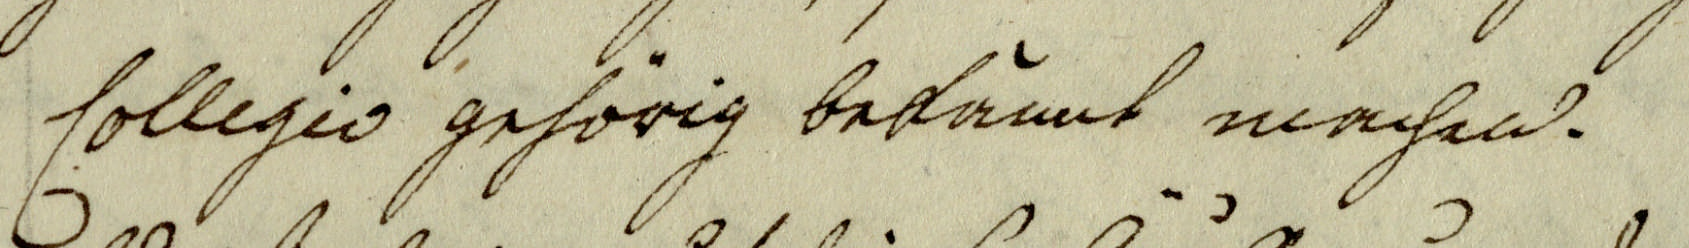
Collegio gehörig bekannt machen.
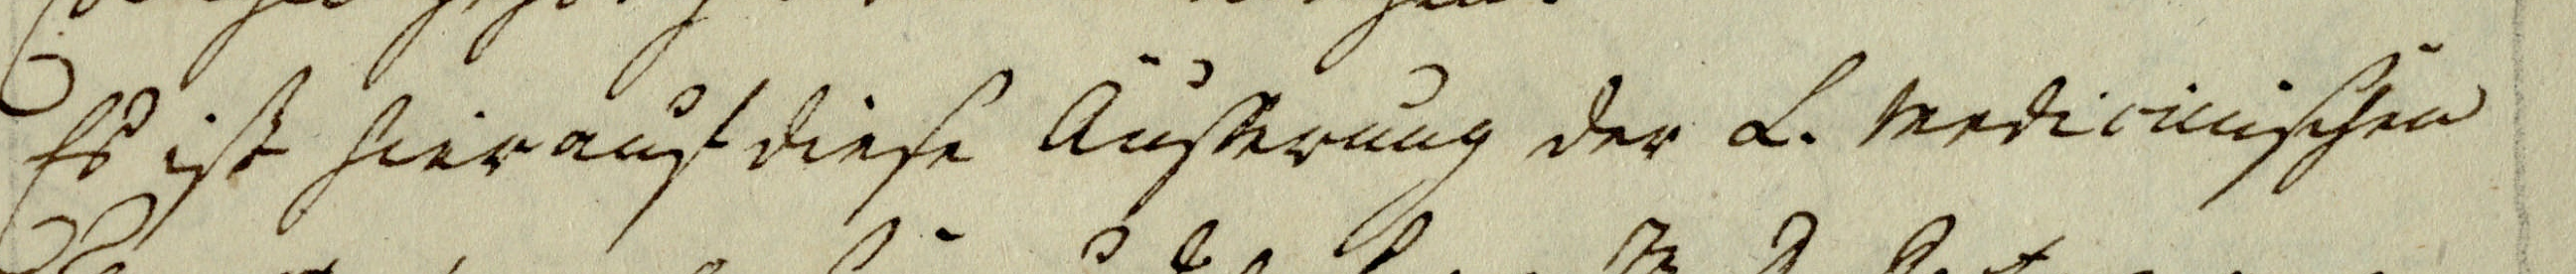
Es ist hierauf diese Äusserung der L. Medicinischen
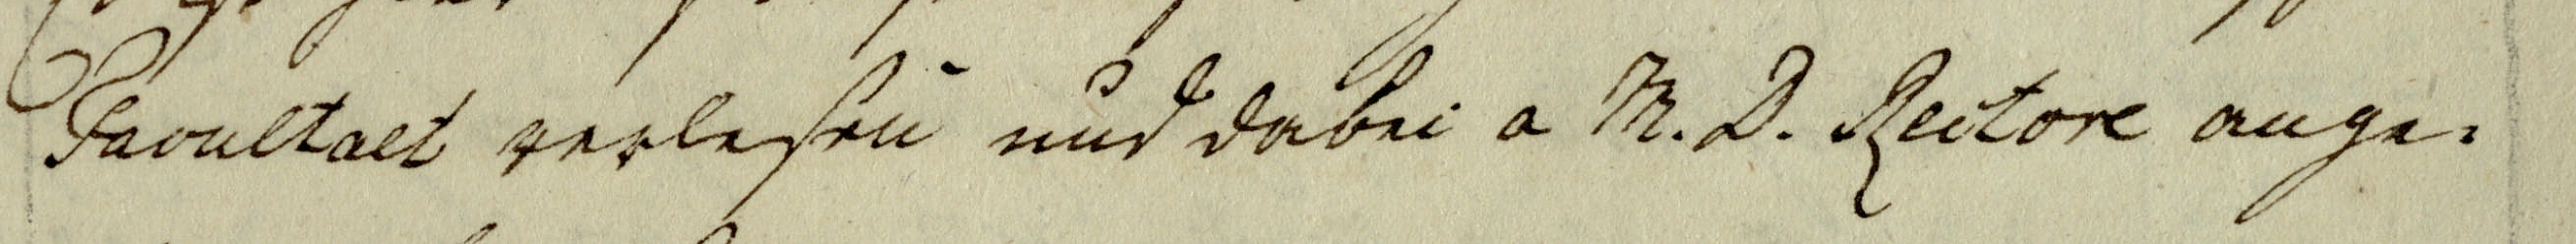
Facultaet verlesen und dabei a M. D. Rectore ange¬
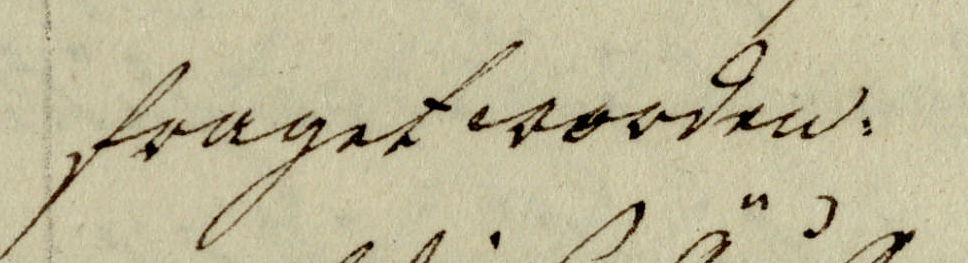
fraget worden:
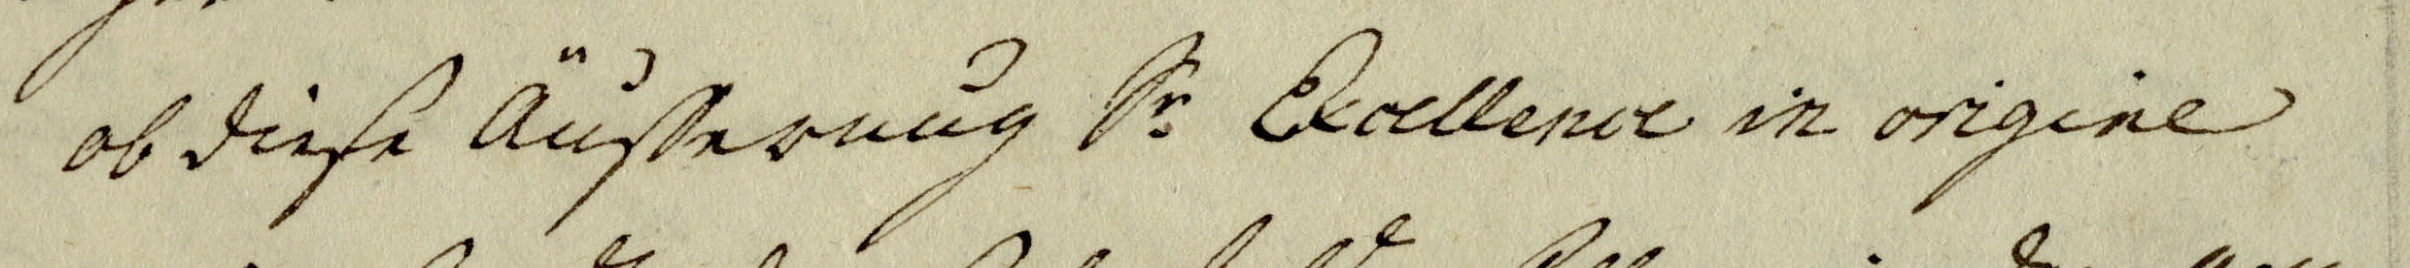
ob diese Äusserung Sr Excellence in origine
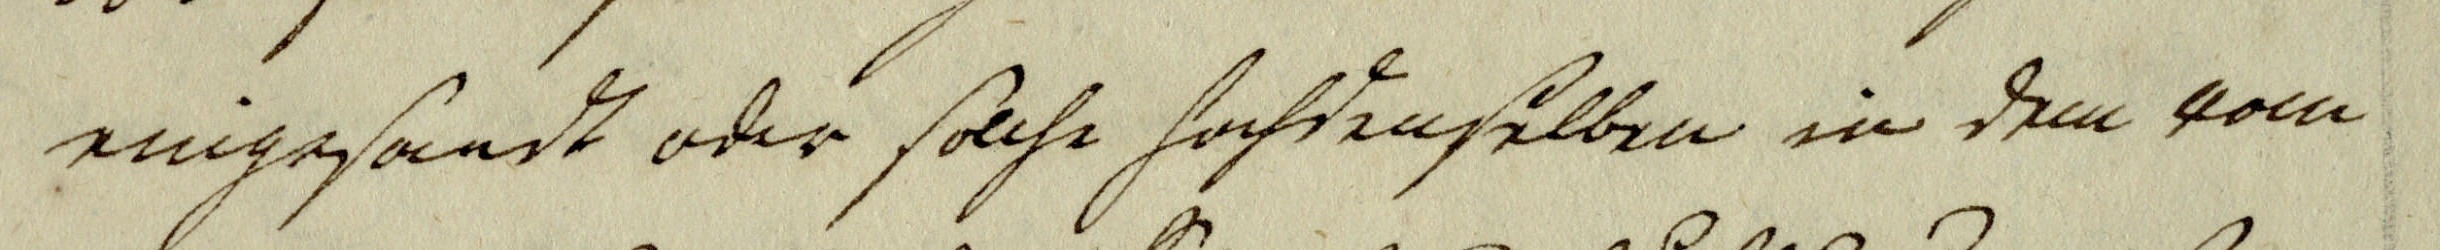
eingesandt oder solche Hochdenselben in dem vom
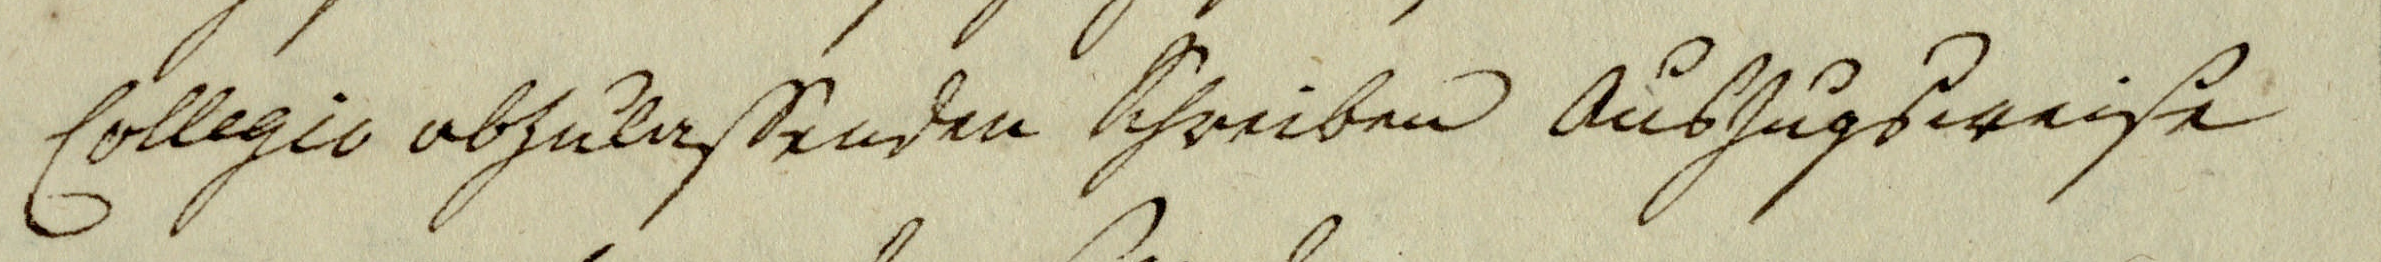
Collegio abzulassenden Schreiben Auszugsweise
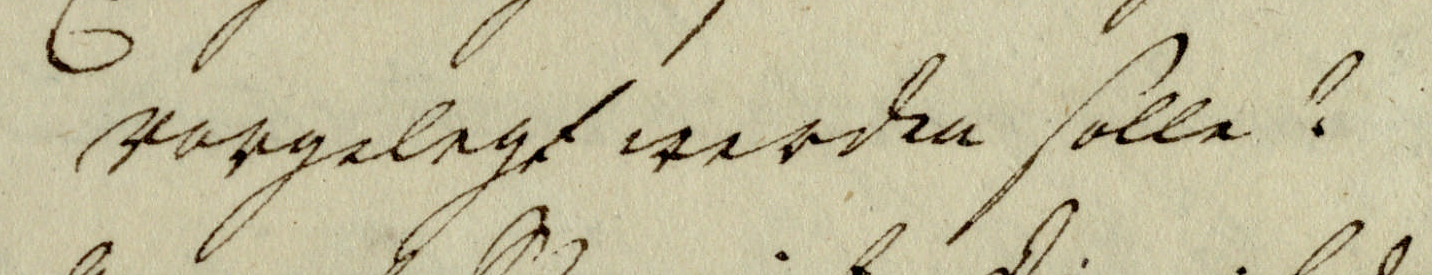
vorgelegt werden solle?
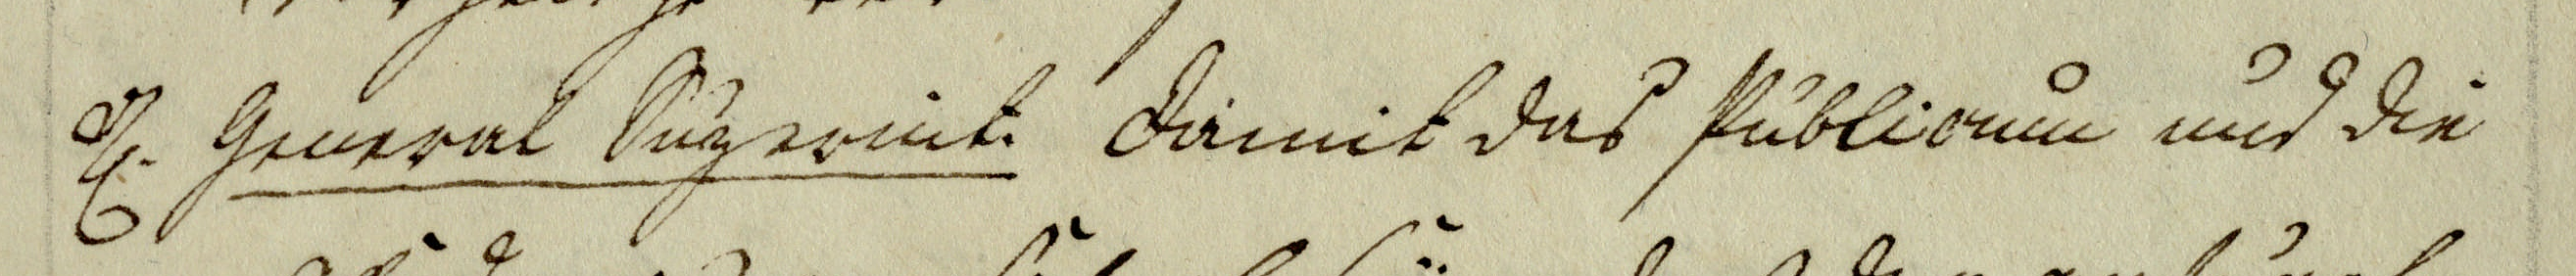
dh. General Superint. Damit das Publicum und die
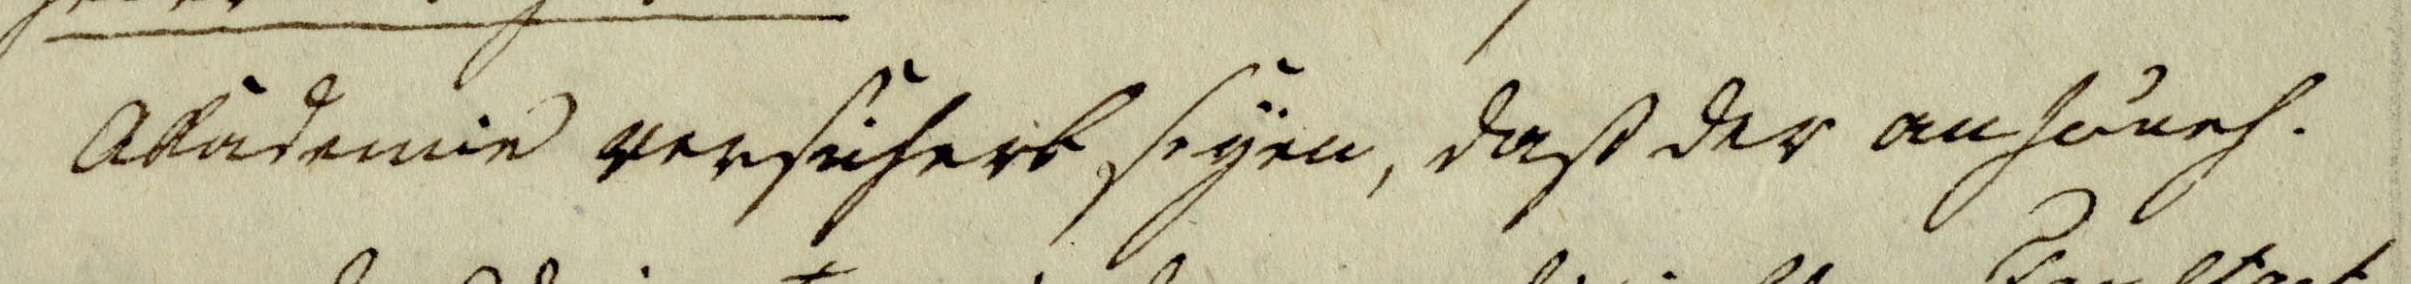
Akademie versichert seÿen, daß der anzuneh¬
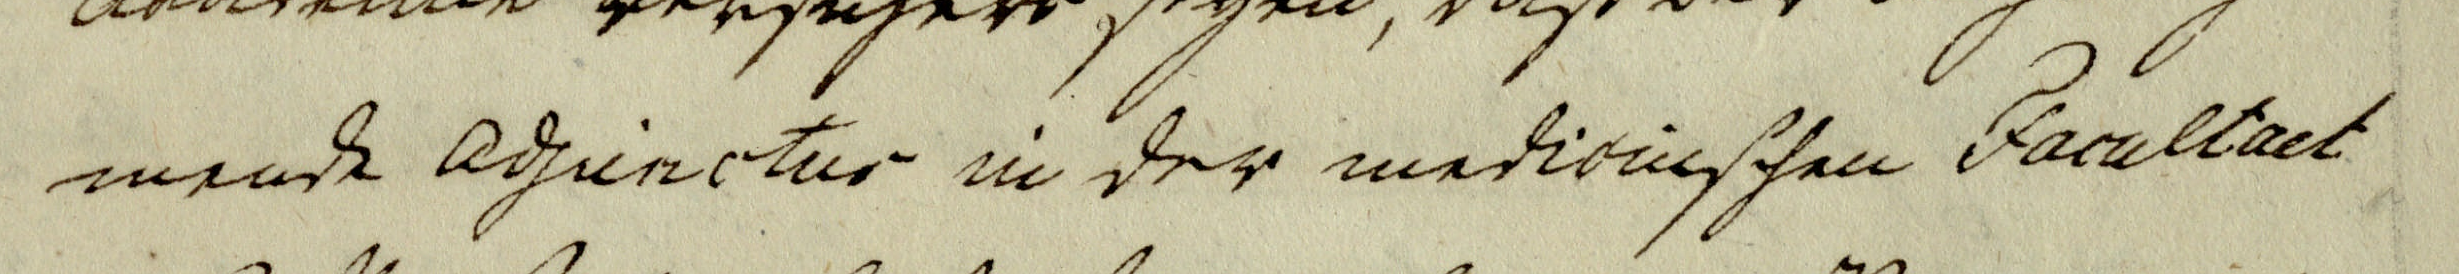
mende Adjunctus in der medicinischen Facultaet
